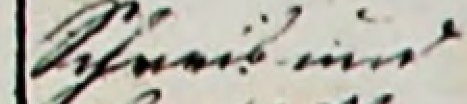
Schreib und
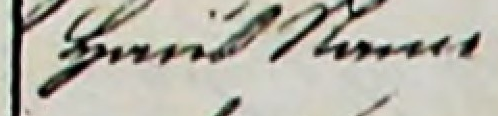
Haus Name
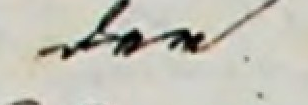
der
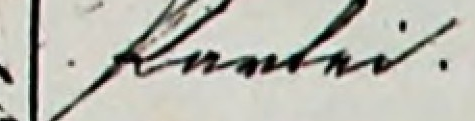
Partei.
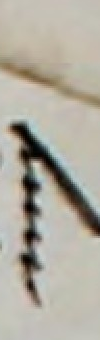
ung
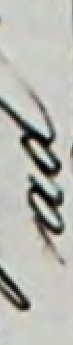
ad
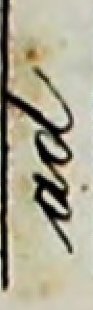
ad
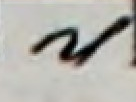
J.
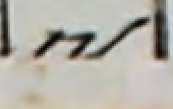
K.
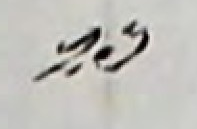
23
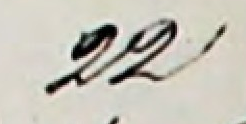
22
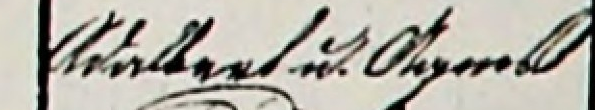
Adalbert u. Agnes
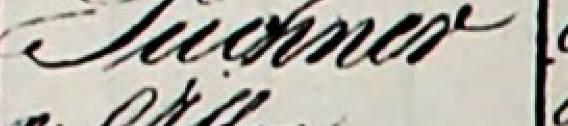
Puchner
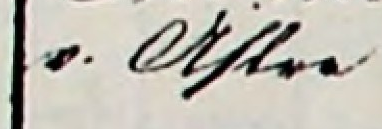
v. Astre
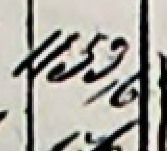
1153,6
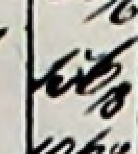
1?6,8
